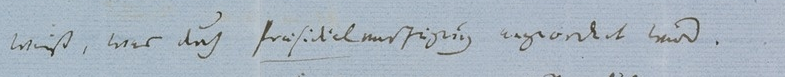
weiß, was durch Präsidialverfügung angeordnet wird.
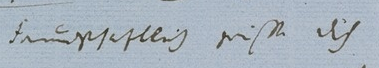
Freundschaftlich grüßt Dich
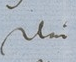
Dein
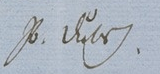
Jb. Dubs.
